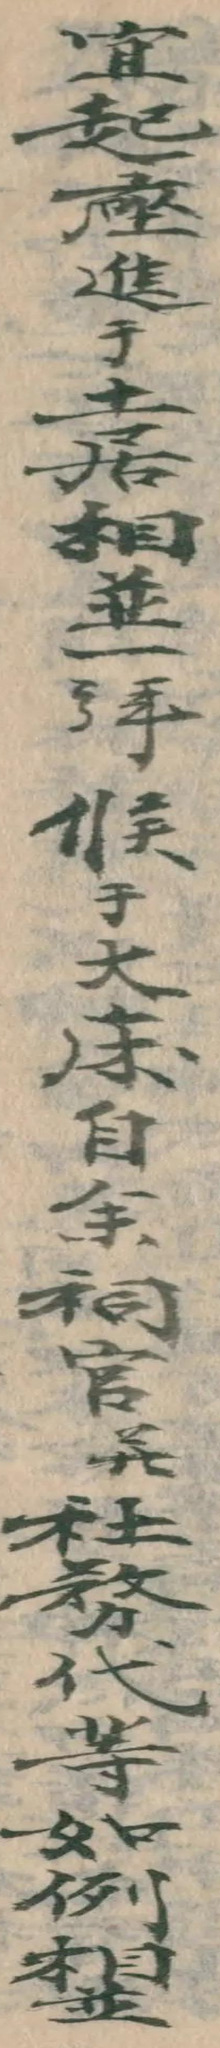宜起座進于土居相並一拝候于大床自余祠官并社務代等如例相並
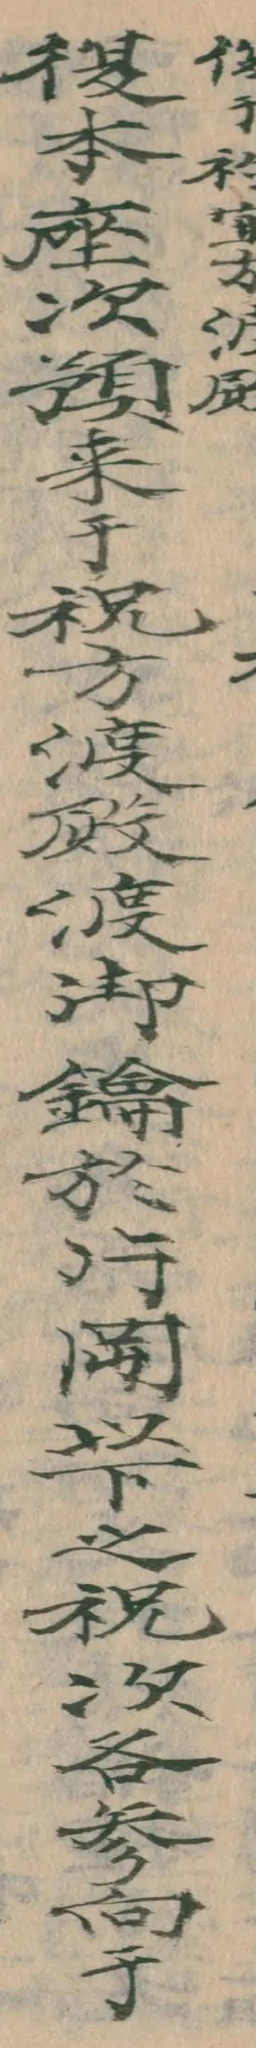復本座次預来于祝方渡殿渡御鑰於片岡以下之祝次各参向于
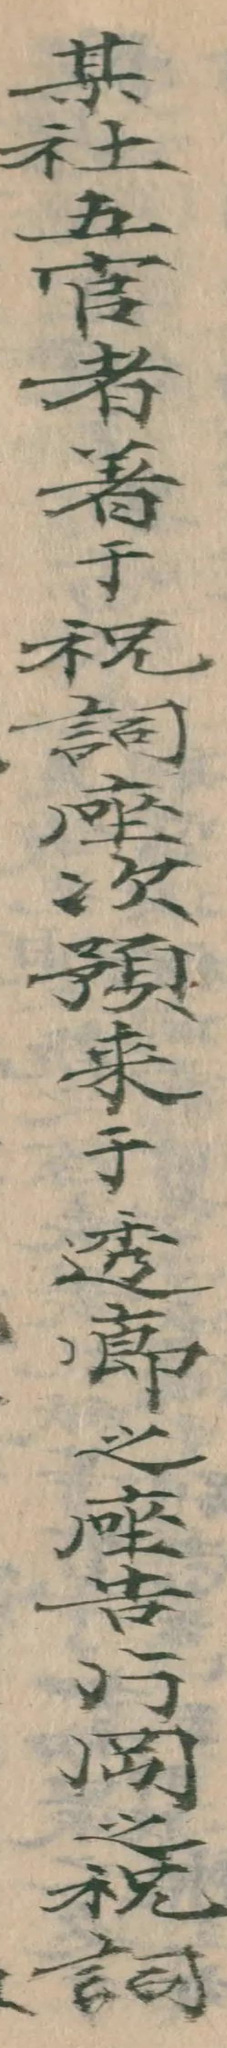某社五官者着于祝詞座次預来于透廊之座告片岡之祝詞
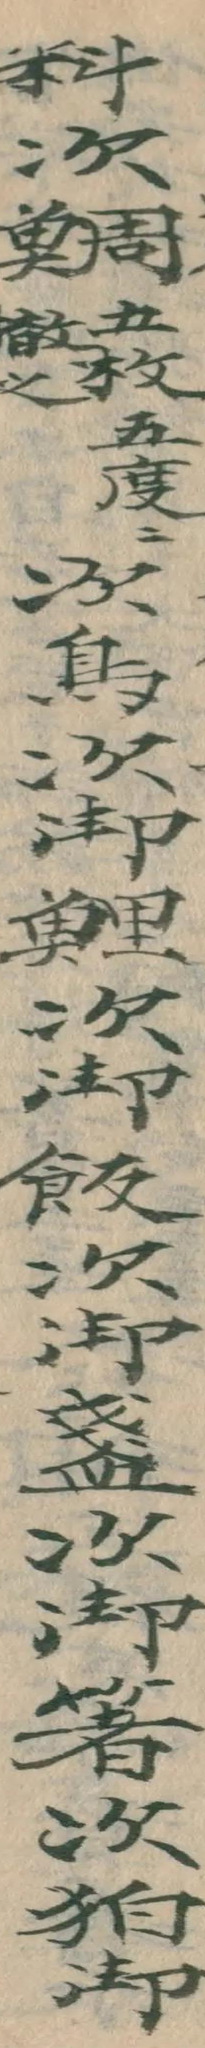料次鯛五枚五度ニ撤之次鳥次御鯉次御飯次御盞次御箸次狛御
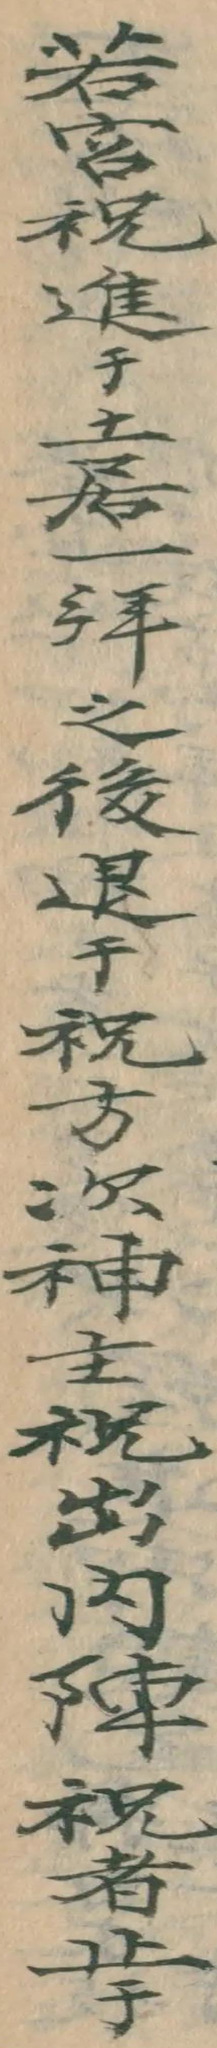若宮祝進于土居一拝之後退于祝方次神主祝出内陣祝者止于

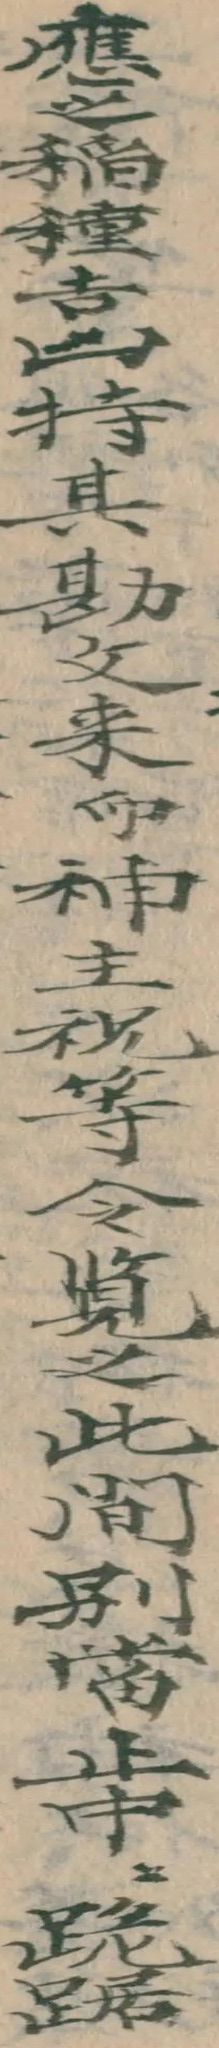応之稲種吉凶持其勘文来而神主祝等令覧之此間別当正中ニ跪踞
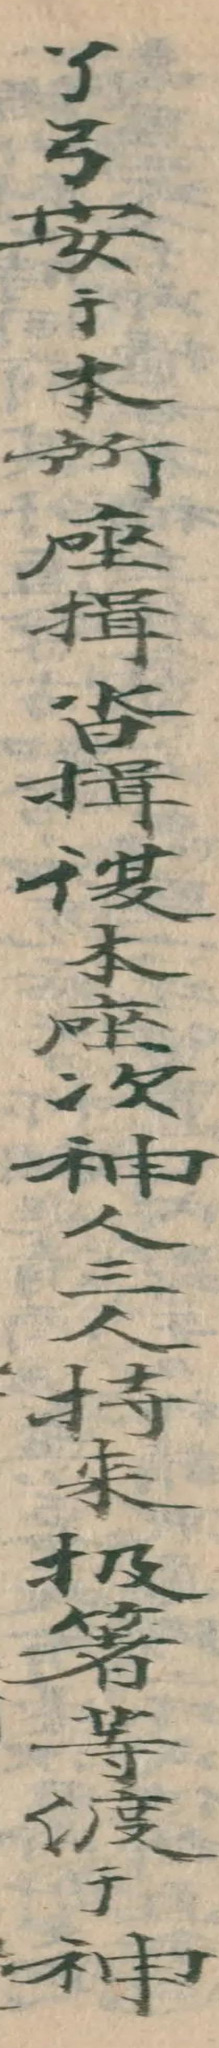了弓安于本所座揖沓揖復本座次神人三人持来扱箸等渡于神

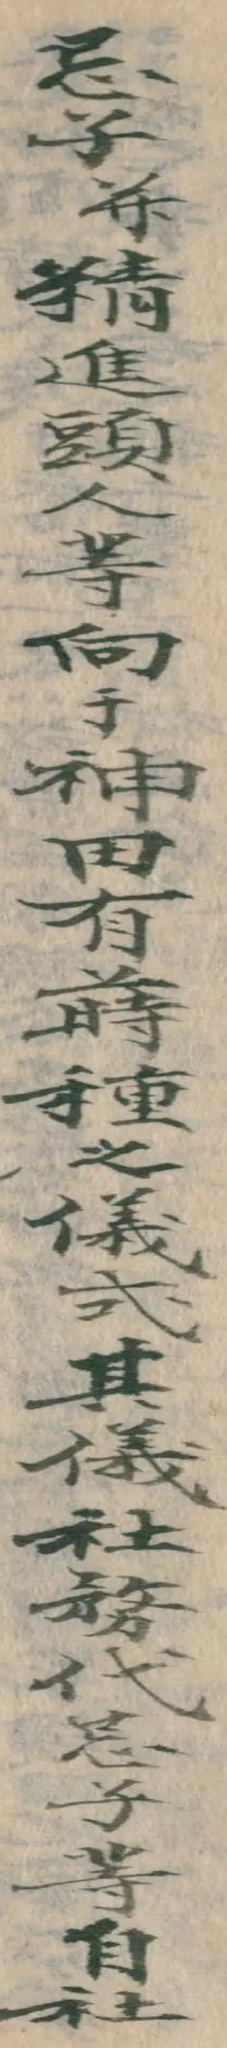忌子并精進頭人等向于神田有蒔種之儀式其儀社務代忌子等自社
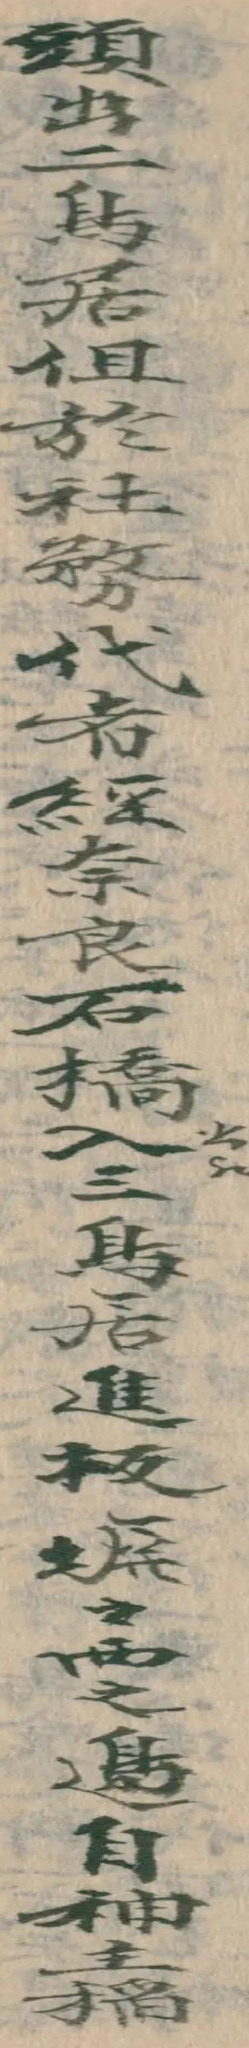頭出二鳥居但於社務代者経奈良石橋入三鳥居進板塀之西之辺自神主稲
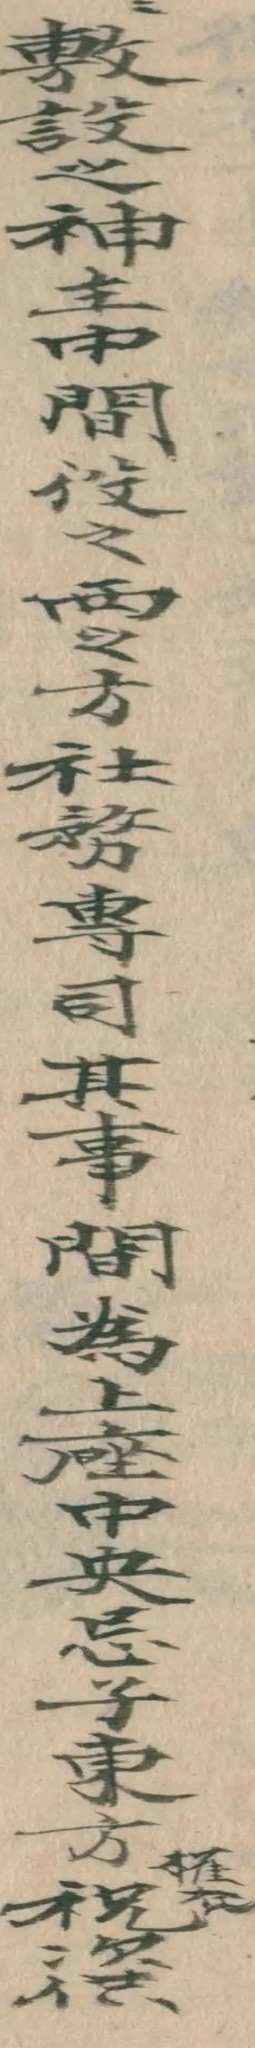ニ敷設之神主中間役之西之方社務専司其事間為上座中央忌子東方祝次供
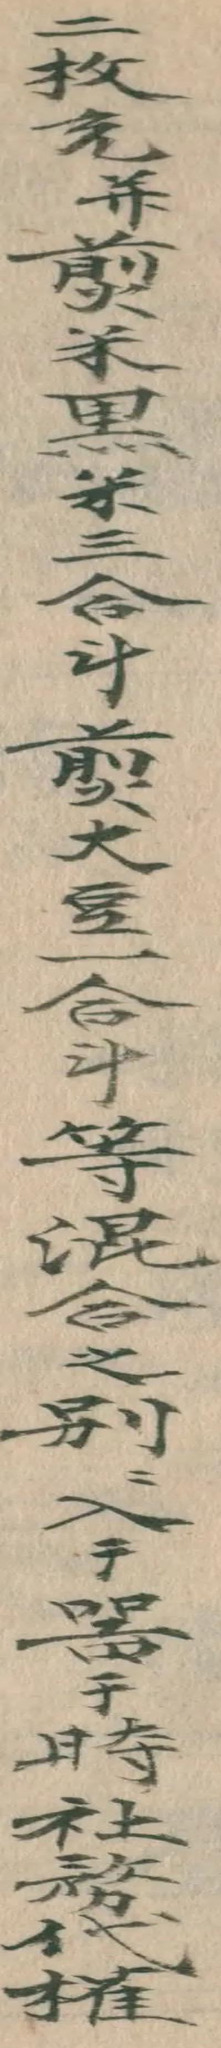二枚充并煎米黒米三合計煎大豆一合計等混合之別ニ入于器于時社務代権
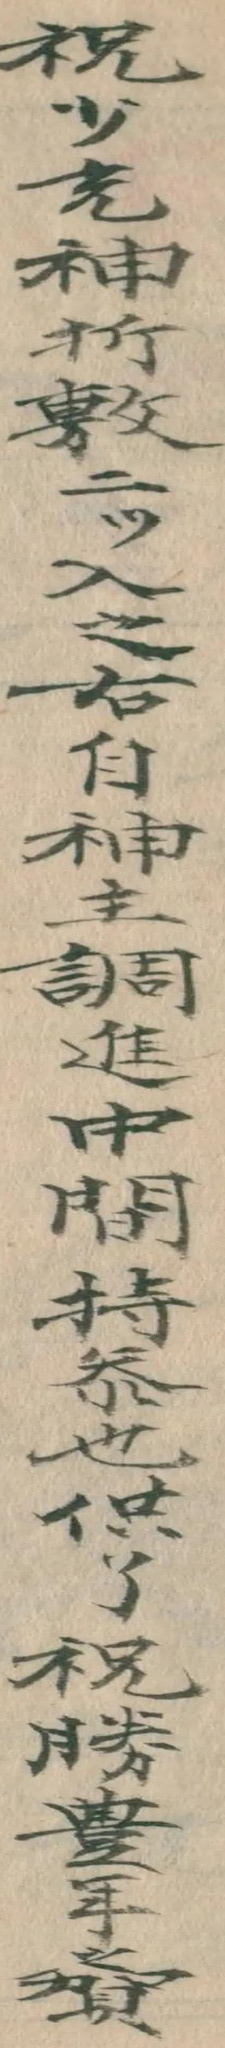祝少充神折敷二ツ入之右自神主調進中間持参也供了祝勝豊年之賀
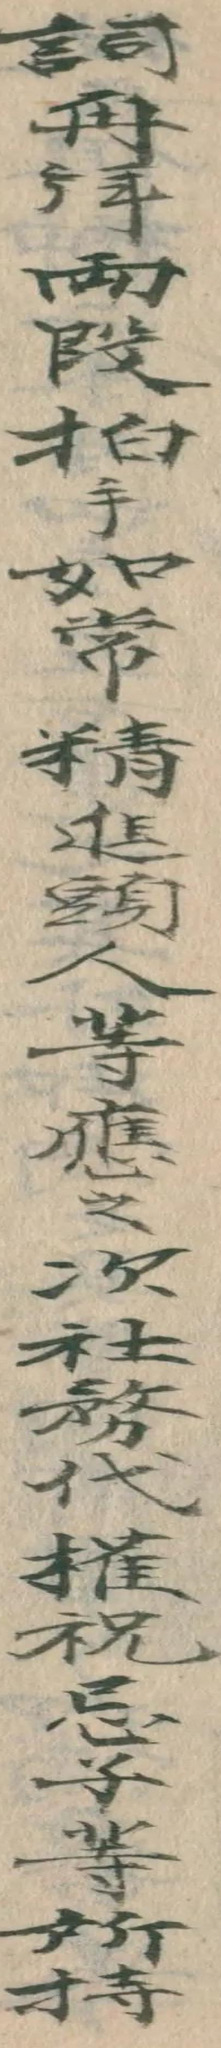詞再拝両段拍手如常精進頭人等応之次社務代権祝忌子等所持

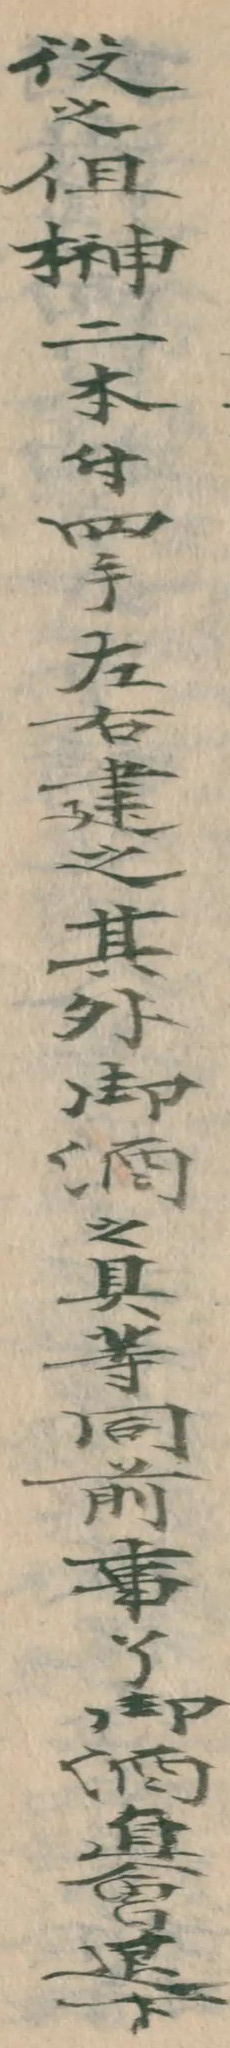役之但榊二本付四手左右建之其外御酒之具等同前事了御酒直会退下

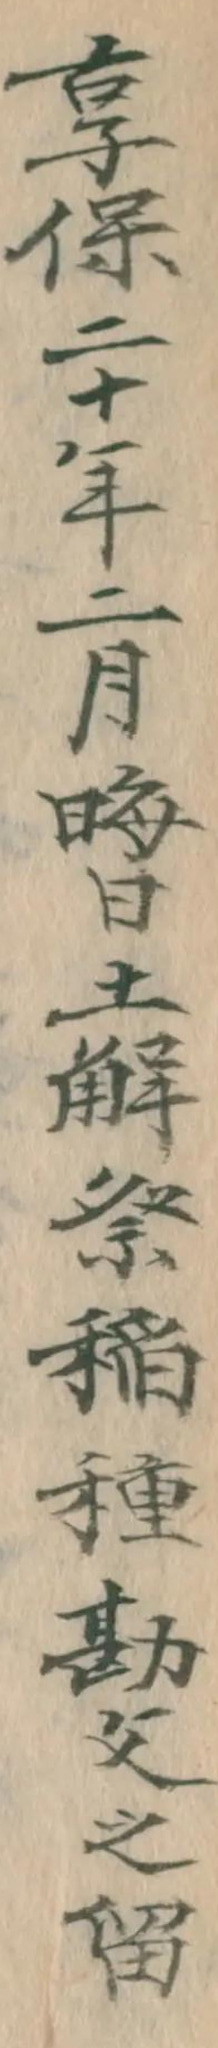享保二十年二月晦日土解祭稲種勘文之留
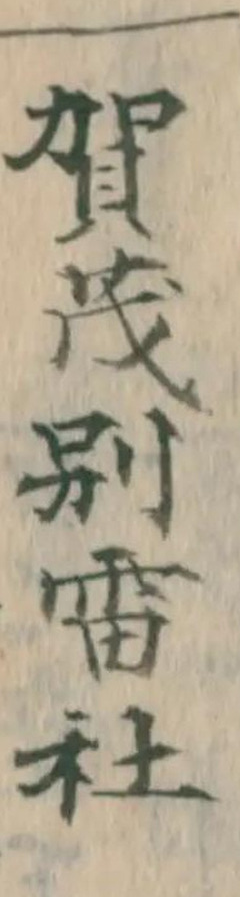賀茂別雷社
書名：賀茂社記録. 第9冊
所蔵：国立国会図書館 National Diet Library, JAPAN
